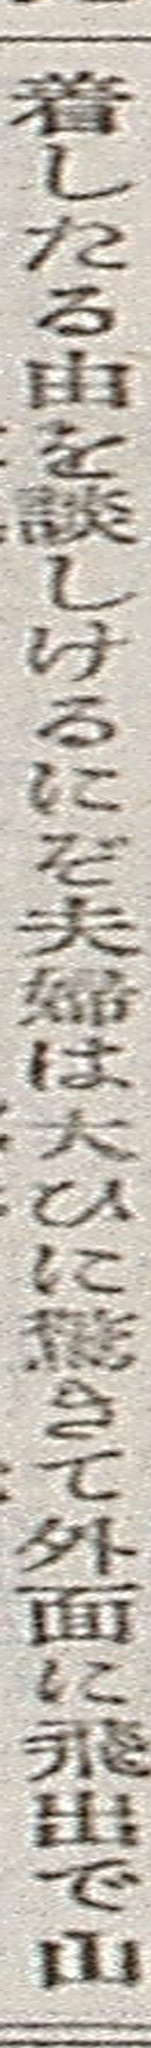着したる由を談しけるにぞ夫婦は大ひに驚きて外面に飛出で山
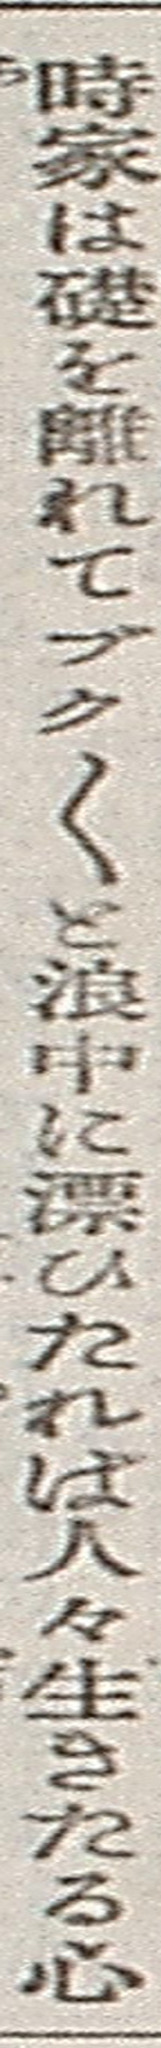時家は礎を離れてブク〳〵と浪中に漂ひたれは人々生きたる心
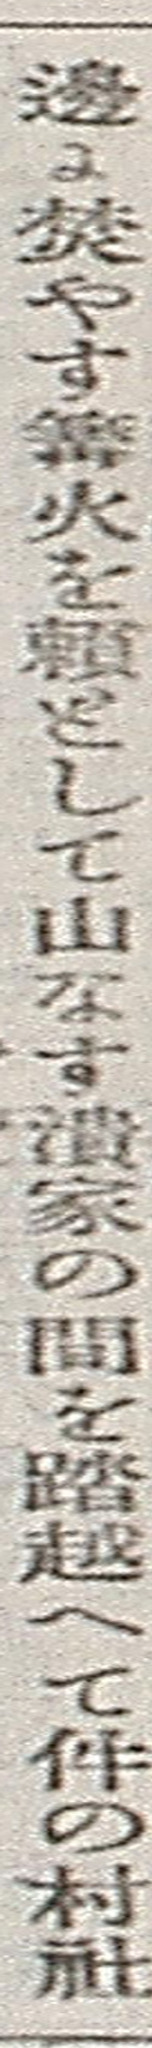辺に焚やす篝火を頼として山なす潰家の間を踏越へて件の村社
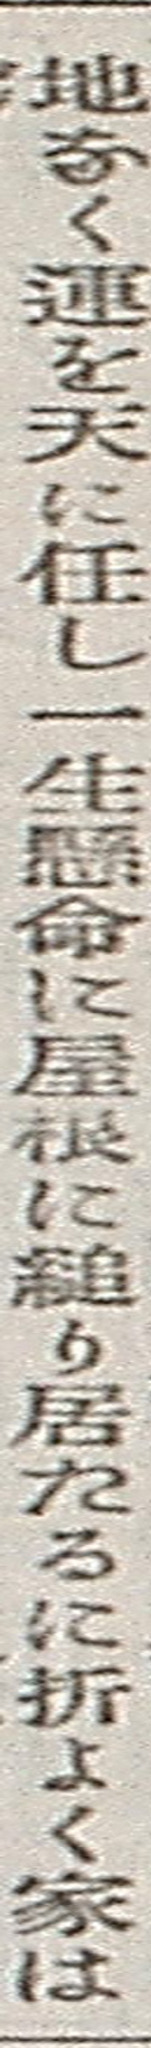地なく運を天に任し一生懸命に屋根に縋り居たるに折よく家は
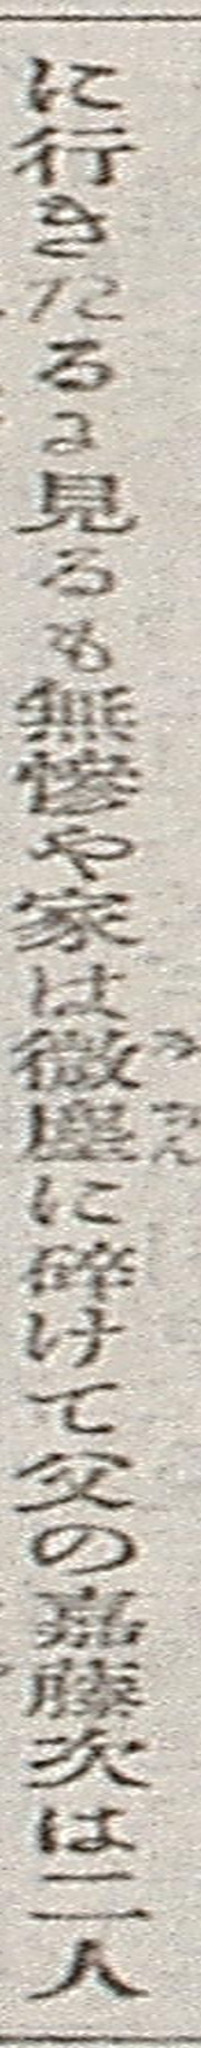に行きたるに見るも無惨や家は微塵に砕けて父の嘉藤次は二人
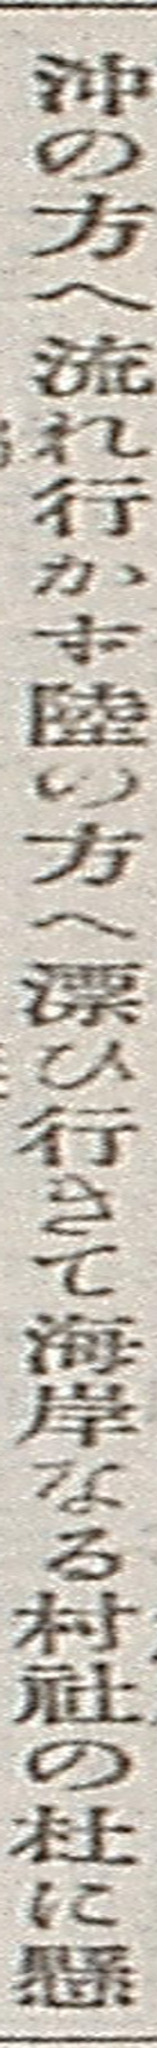沖の方へ流れ行かず陸の方へ漂ひ行きて海岸なる村社の杜に懸
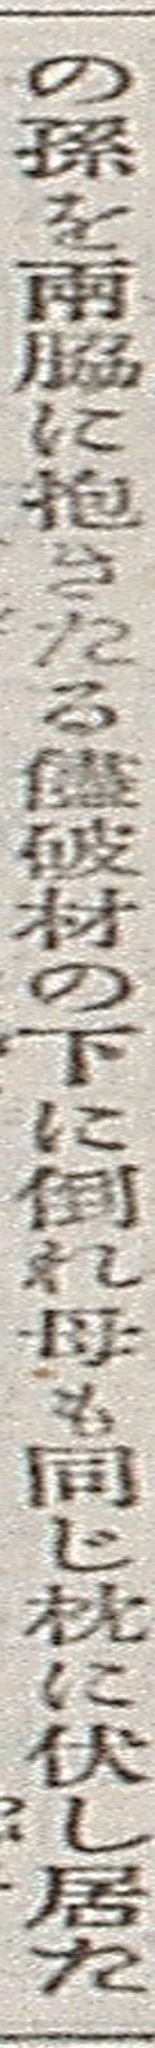の孫を両脇に抱きたる侭破材の下に倒れ母も同じ枕に伏し居た
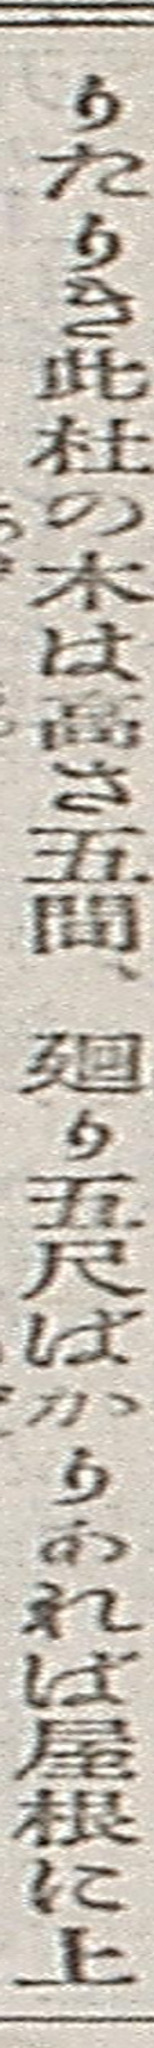りたりき此杜の木は高さ五間、廻り五尺ばかりあれば屋根に上
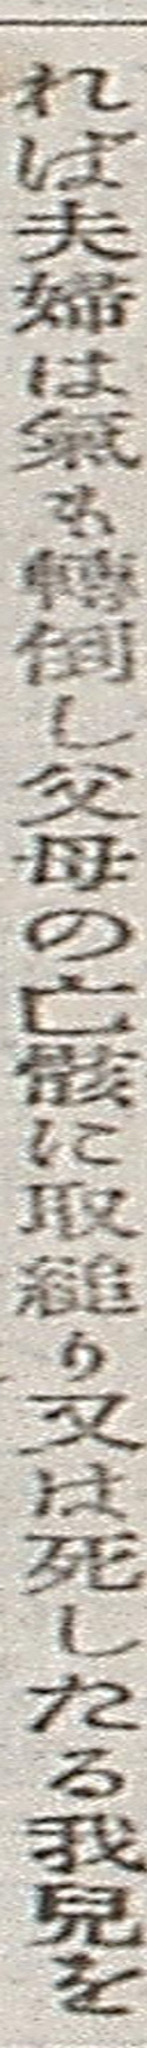れば夫婦は気も転倒し父母の亡骸取縋り又は死したる我兒を
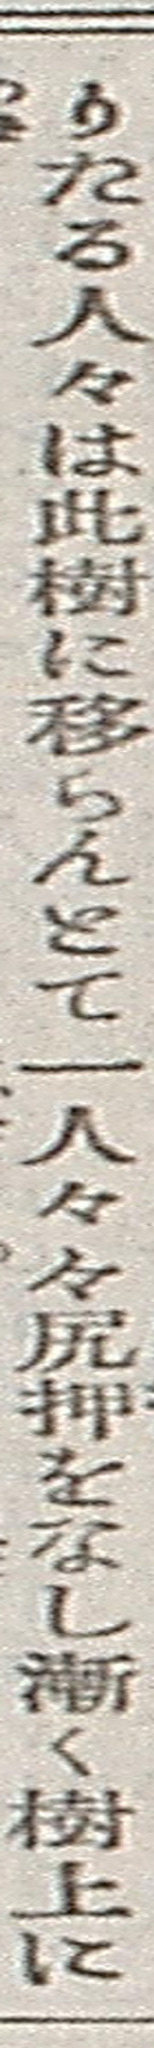りたる人々は此樹に移らんとて一人々々尻押をなし漸く樹上に
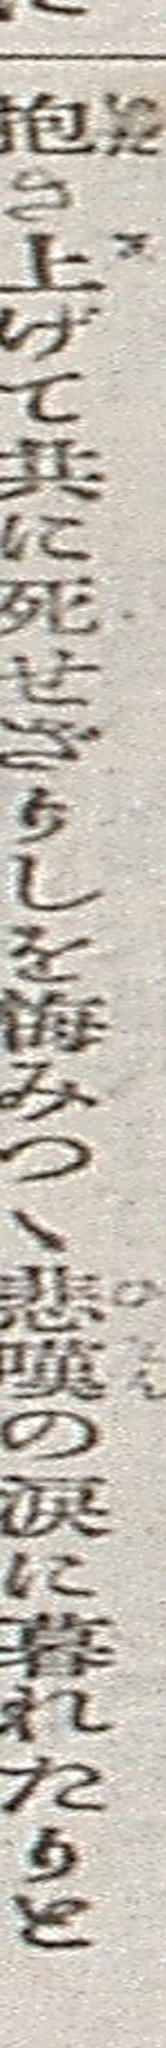抱き上げて共に死せざりしを悔みつゝ悲嘆の涙に暮れたりと
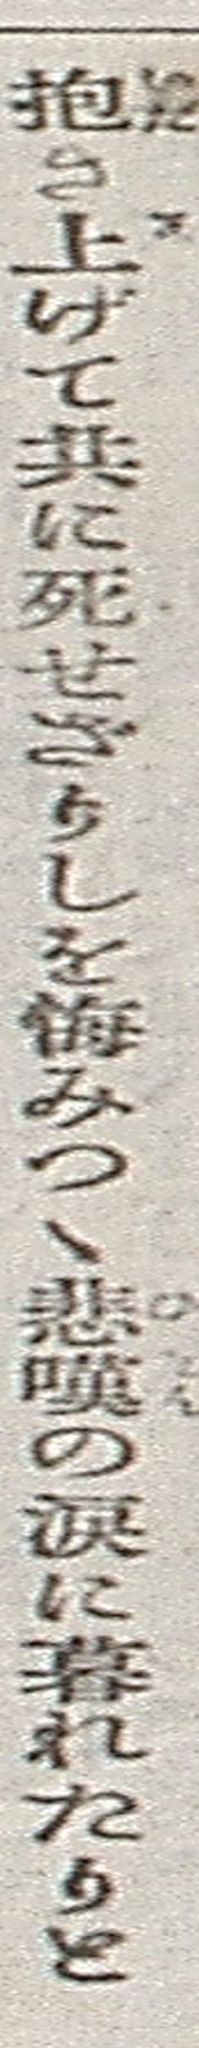抱き上げて共に死せざりしを悔みつゝ悲嘆の涙に暮れたりと
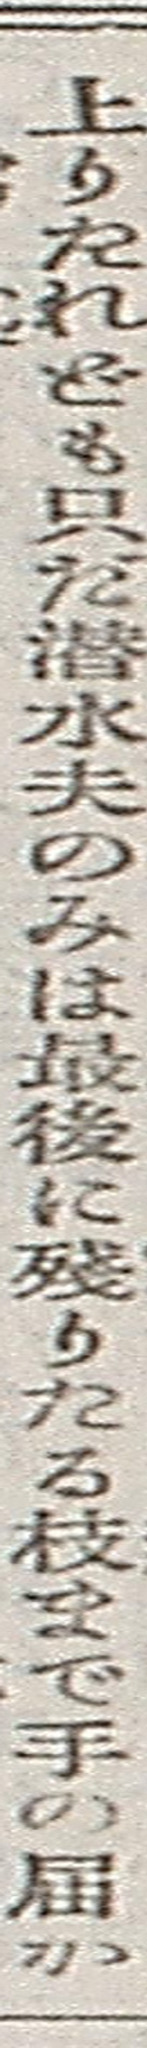上りたれども只だ潜水夫のみは最後に残りたる枝まで手の届か
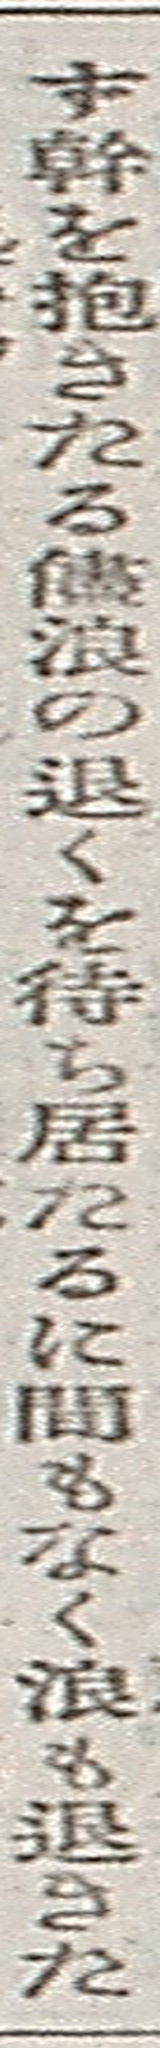ず幹を抱きたる侭浪の退くを待ち居たるに間もなく浪も退きた
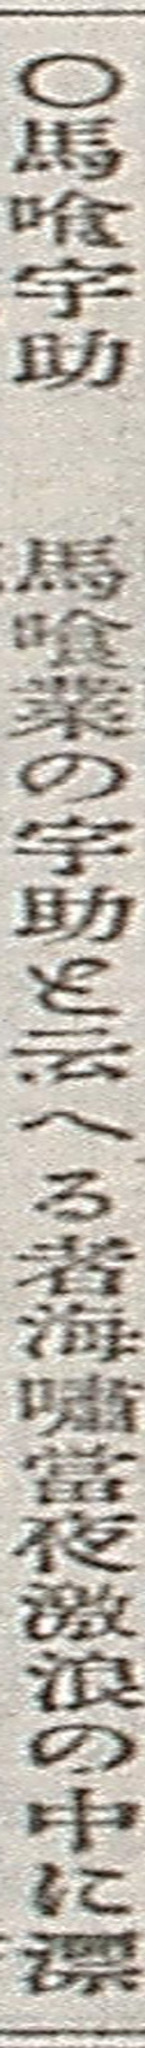○馬喰宇助馬喰業の宇助と云へる者海嘯当夜激浪の中に漂
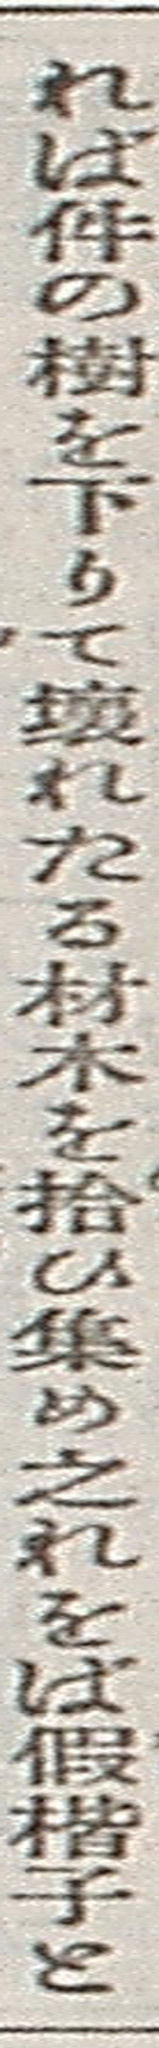れば件の樹を下りて壊れたる材木を拾ひ集め之れをば仮楷子と
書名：風俗畫報臨時増刊第百二十號　大海嘯被害録（下）
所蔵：東京大学地震研究所図書室 Earthquake Research Institute Library, The University of Tokyo, JAPAN
